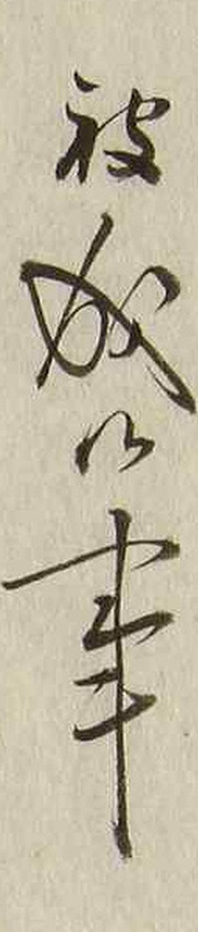被成候事
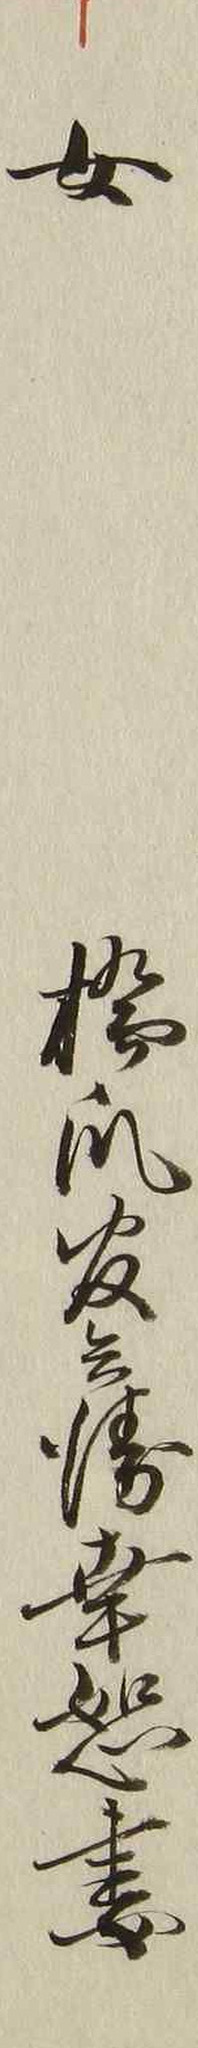女橋爪官兵衛幸恕妻
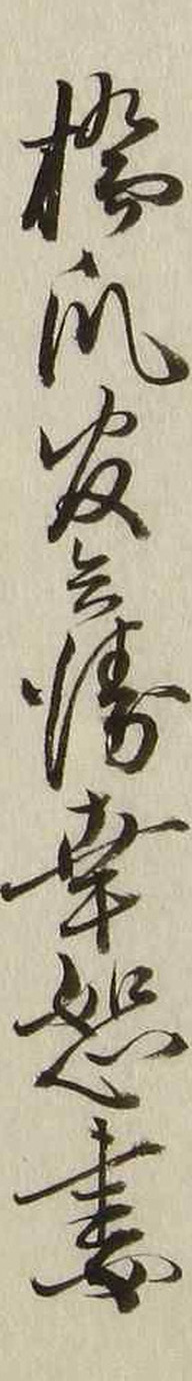女橋爪官兵衛幸恕妻
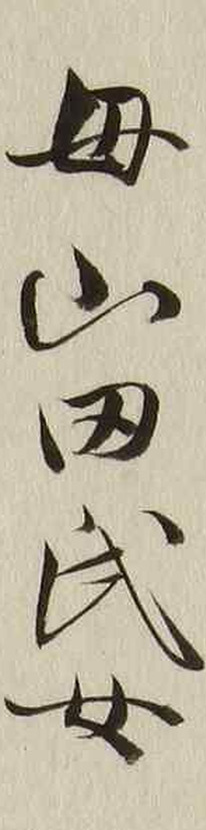母山田氏女
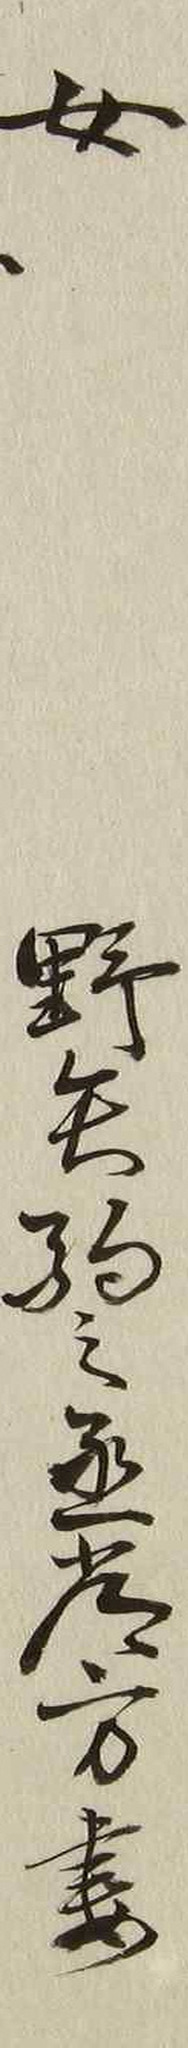女野矢駒之丞常方妻
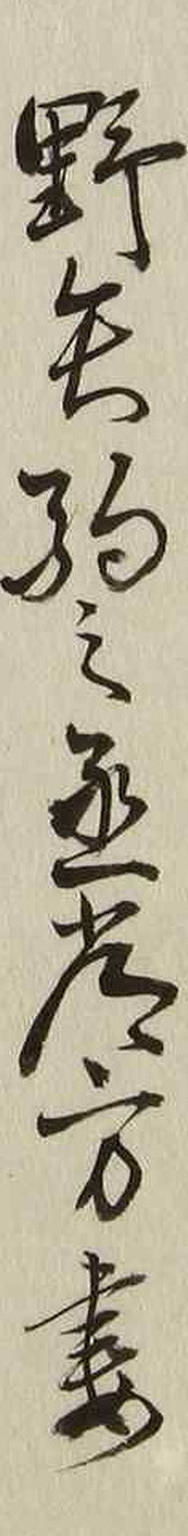女野矢駒之丞常方妻
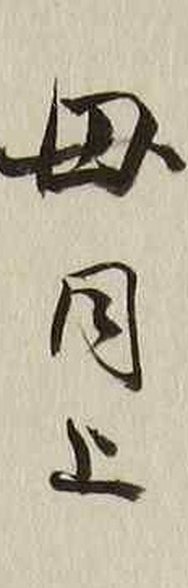母同上
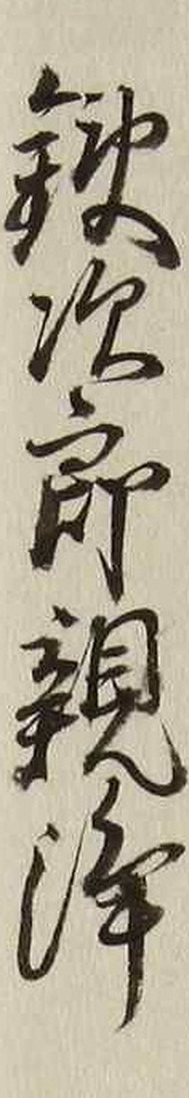鉄次郎親浄
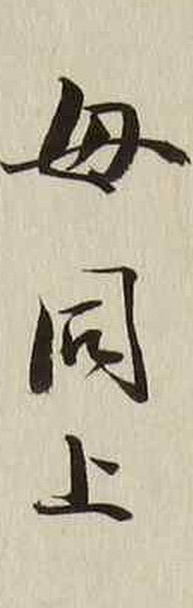母同上
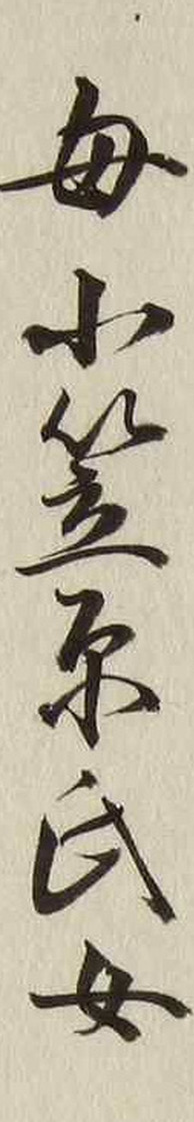母小笠原氏女
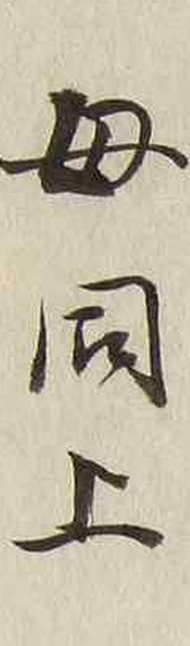母同上

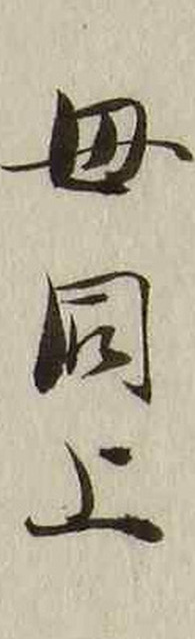母同上
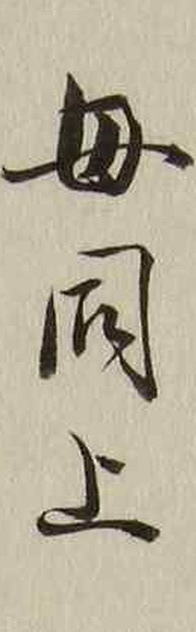母同上
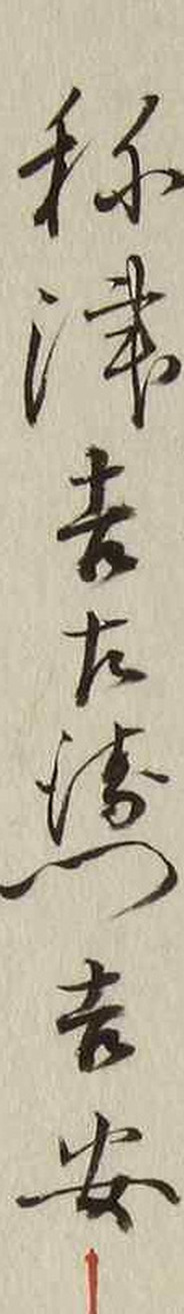称津吉左衛門吉安
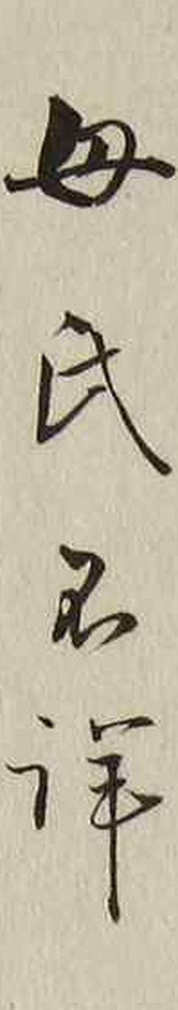母氏不詳
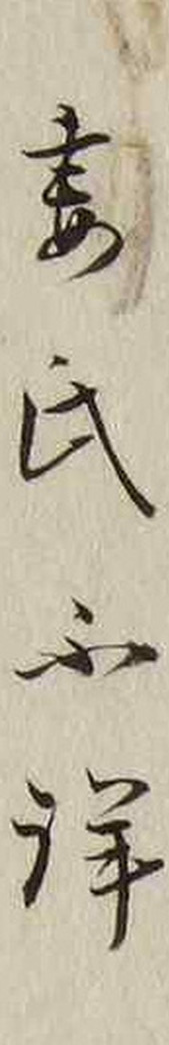妻氏不詳
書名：諸士系譜　巻之157　ね之部1
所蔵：会津若松市立会津図書館
